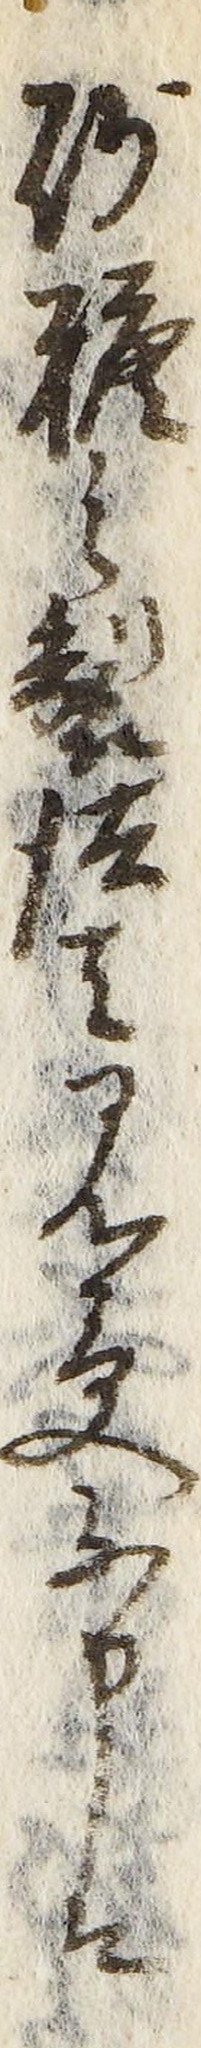砂糖之製法者見受不申候
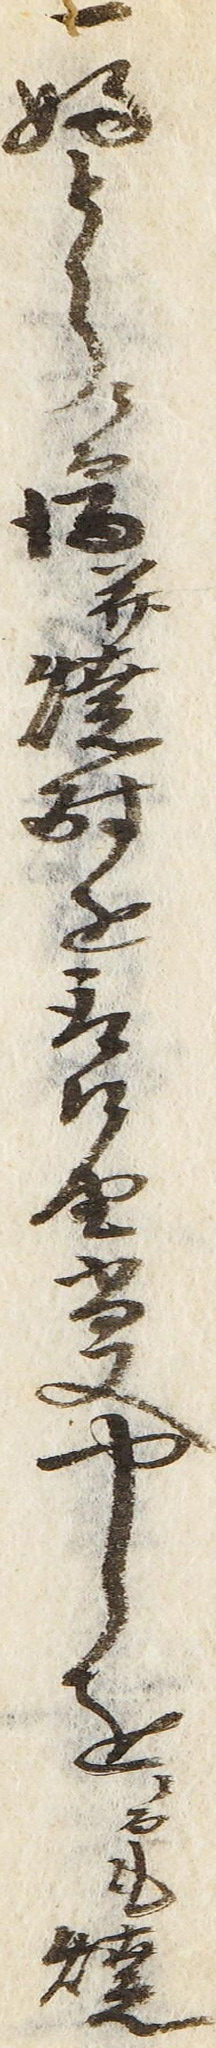一ふとうニ而酒幷焼酎を取候由尚又やしをニ而も焼
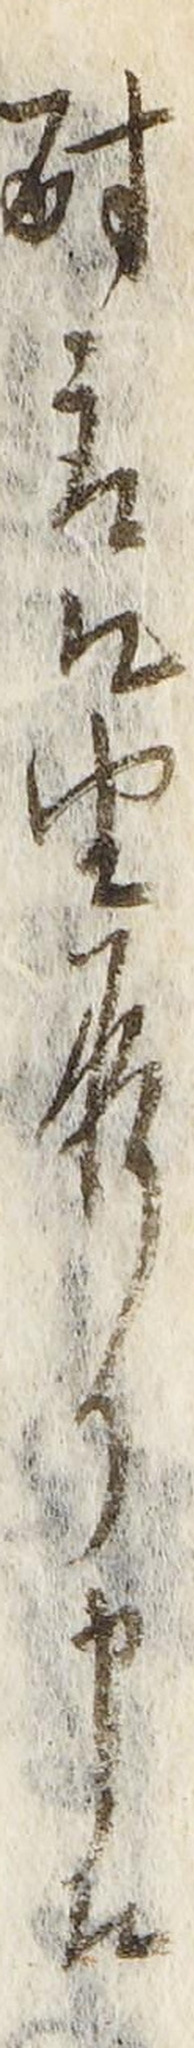酎取候由承り申候
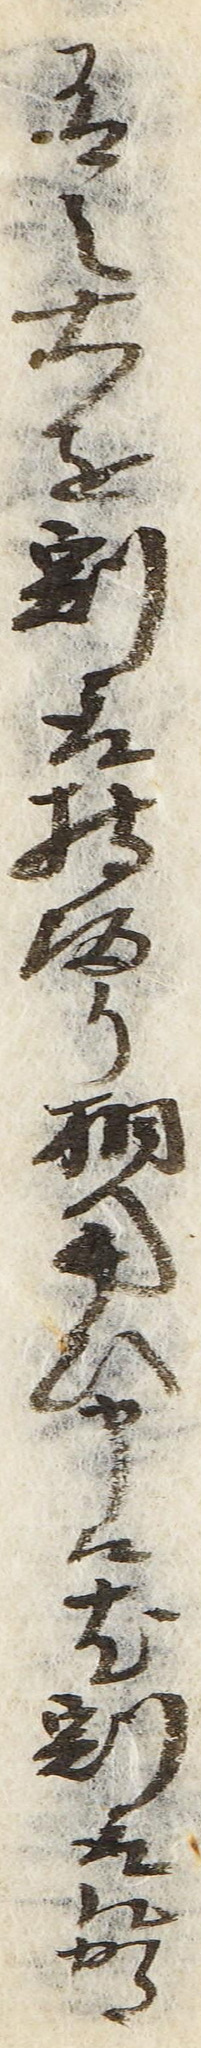有之右を割取持帰り相用ひ申候尤割取候かた
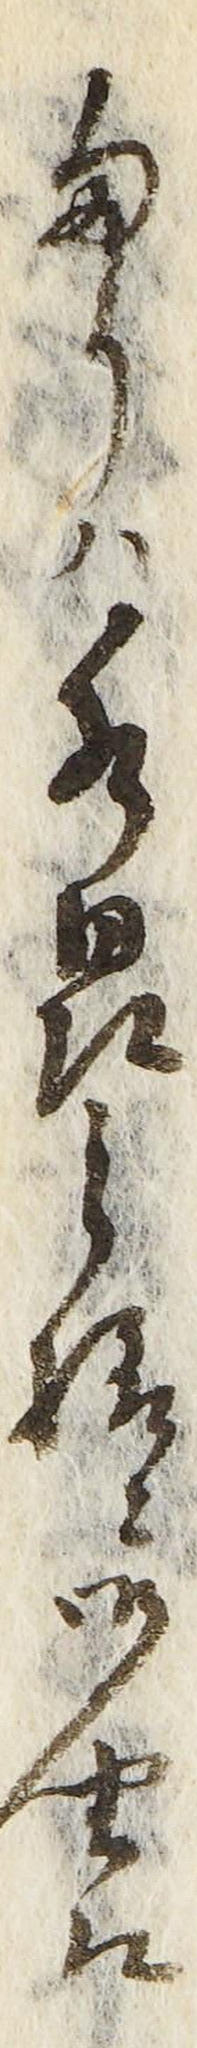まりハ水晶之様ニ御座候
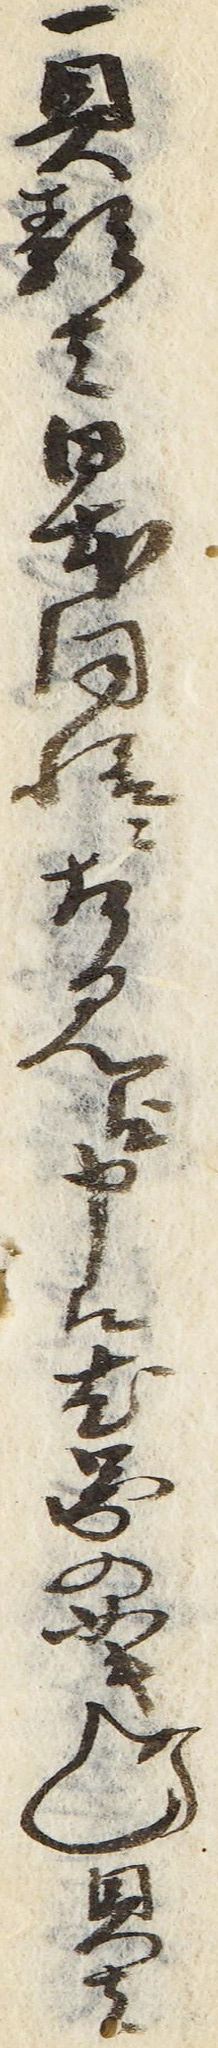一貝類者日本同様ニ相見江申候尤圖の如キ貝者

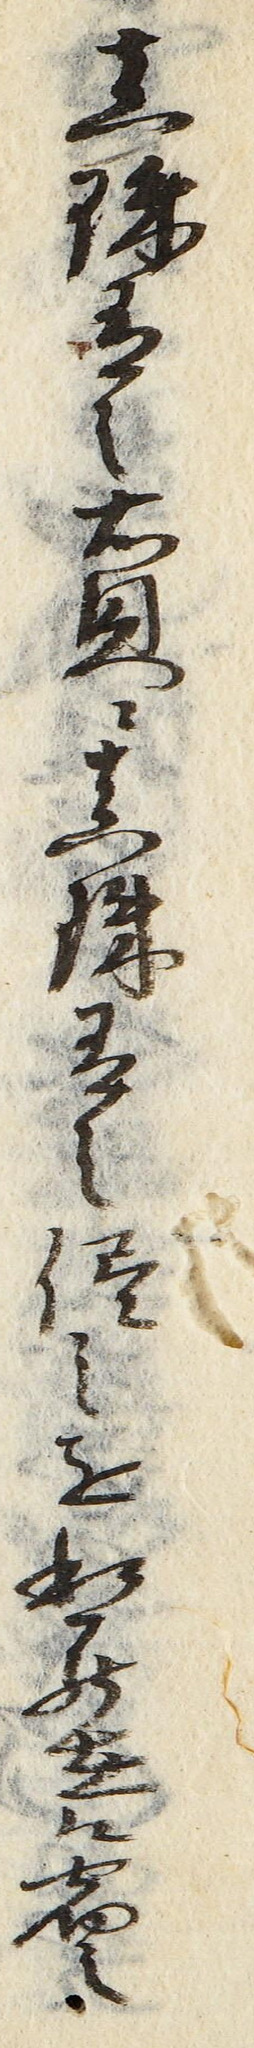真珠有之右貝ニ真珠有之儘之を私罷在候宿之
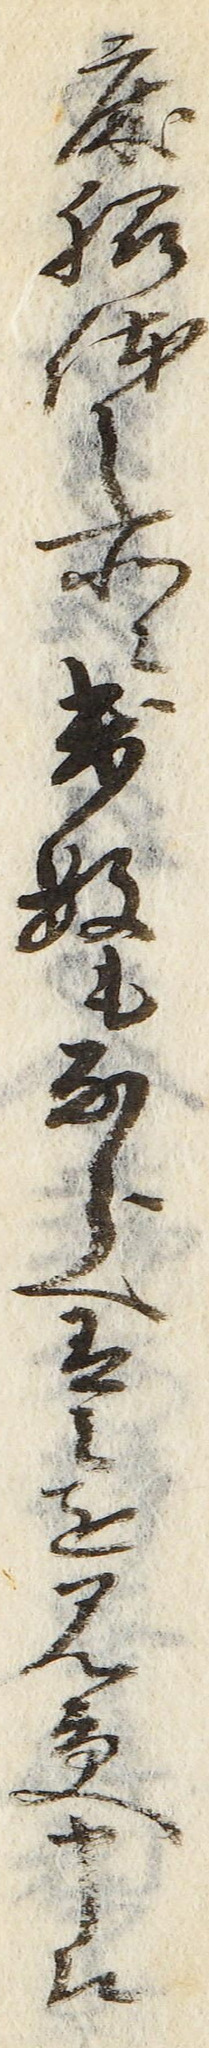床脇体之所ニ幾数もならへ有之を見受申候
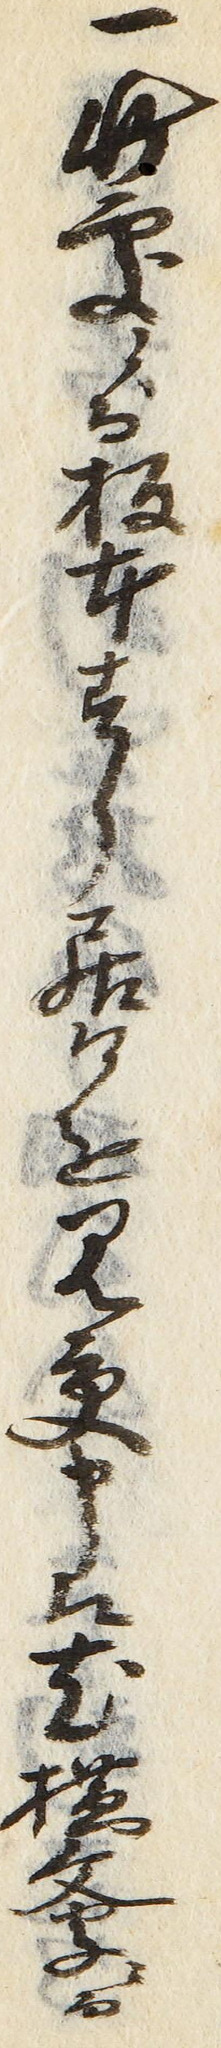一此處ニ而板本すり居候を見受申候尤横文字ニ而
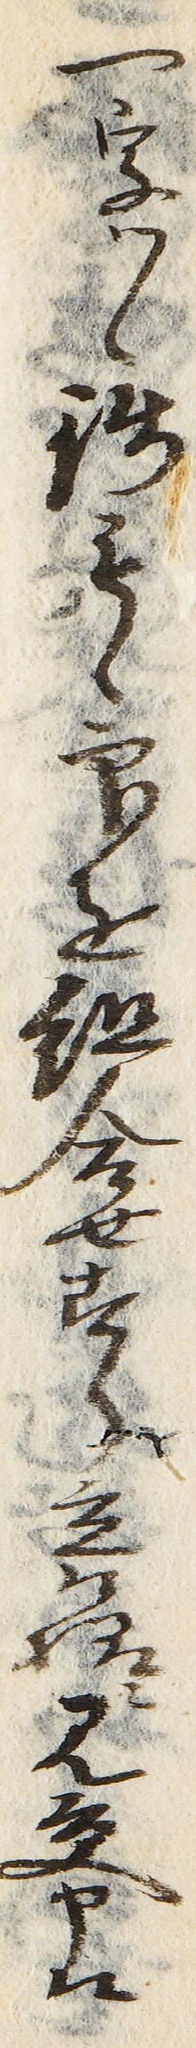一字ツヽ鋳懸候印を組合せすり立候様ニ見受申候
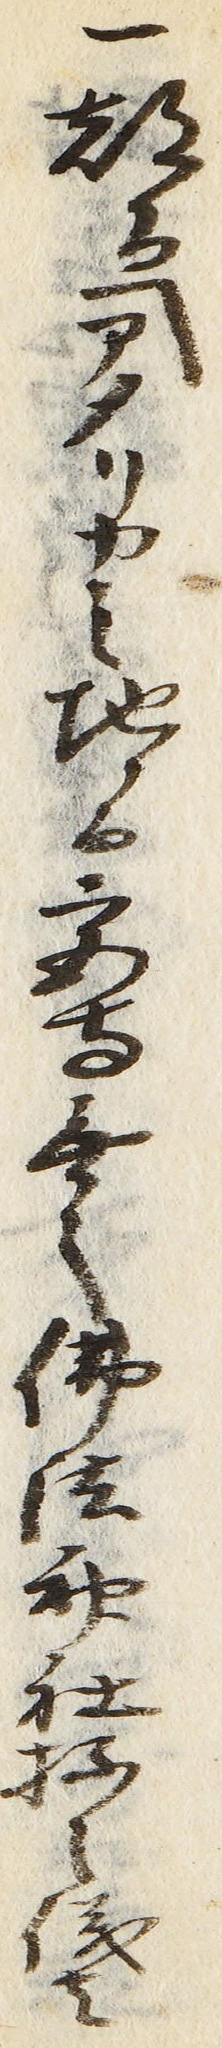一都而「アメリカ之地にて宮寺無之佛法神社抔之儀者
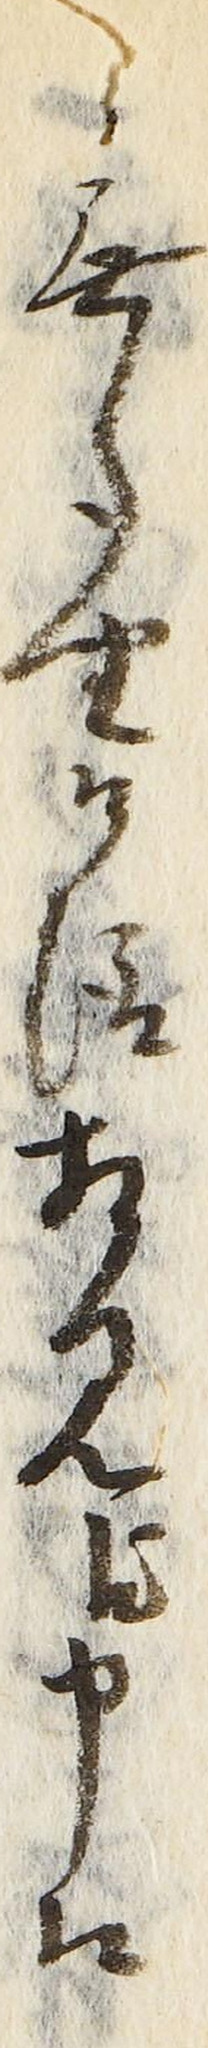無御座候趣相見江申候
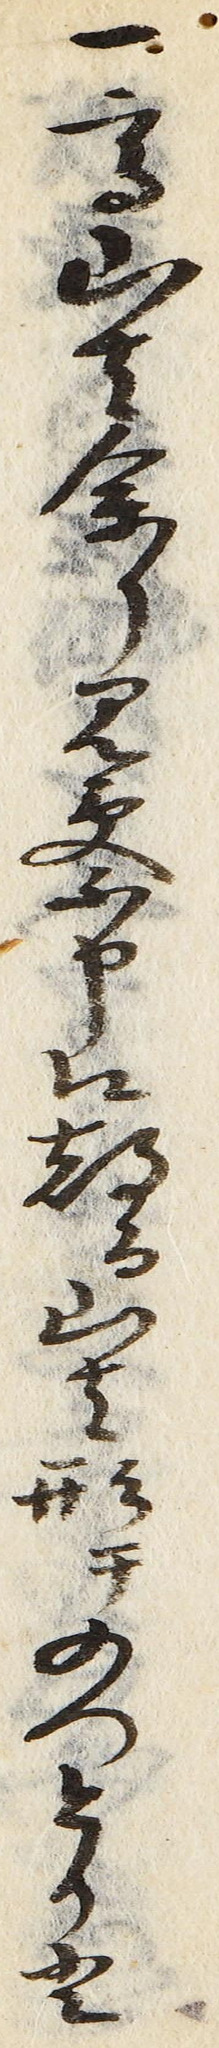一高山者余り見受不申候都而山者形チのつとりと
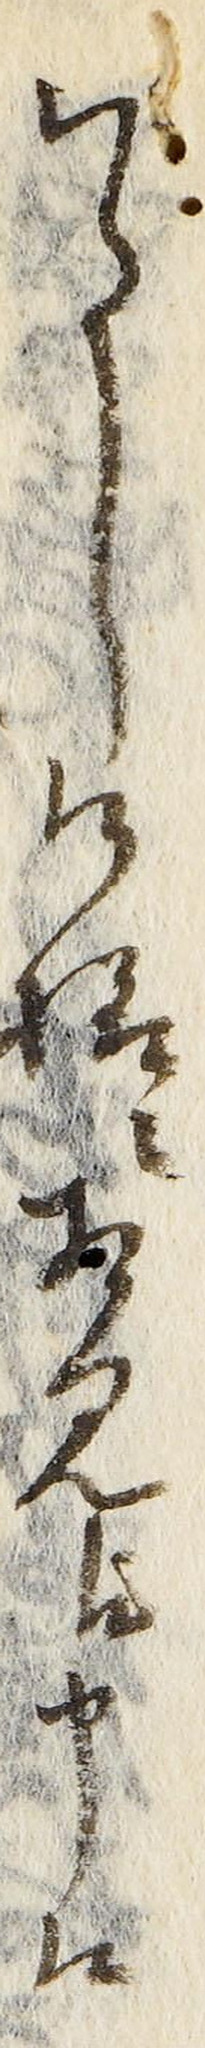いたし候様ニ相見江申候
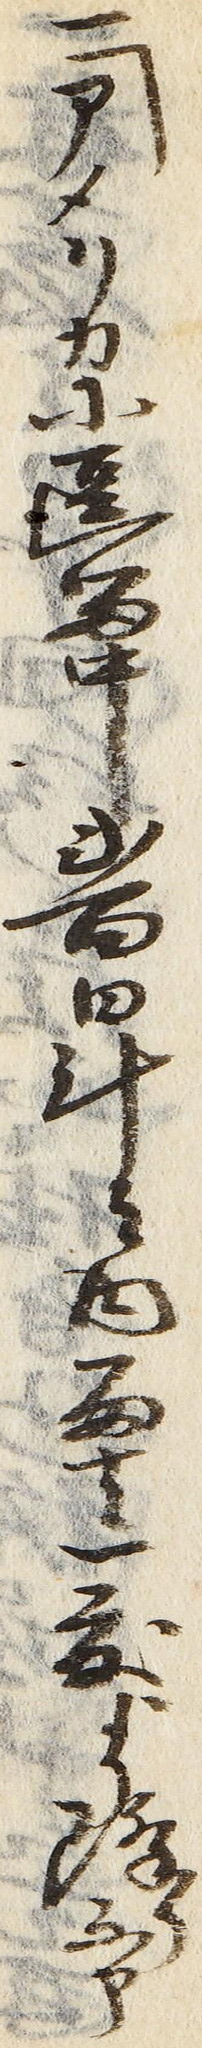一「アメリカに逗留中弐百日斗之内雨者一度より降り不申
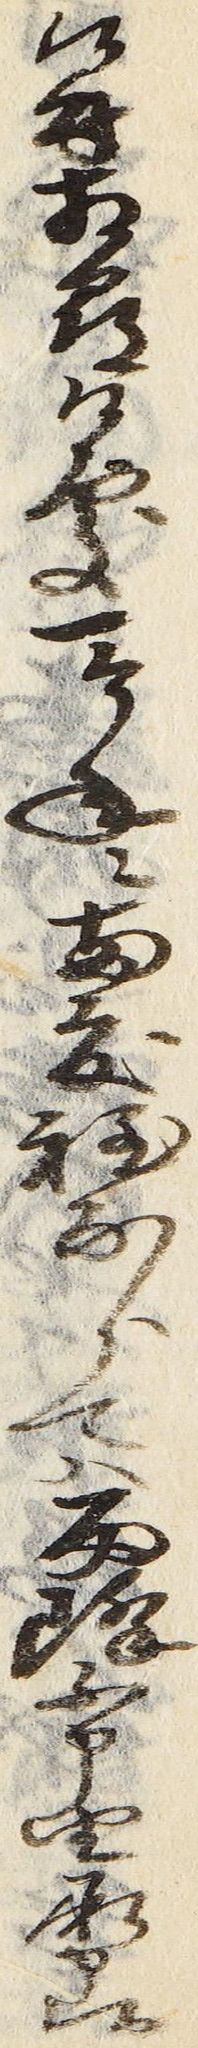候付相尋候處一ケ年ニ両度程ならてハ雨降不申由承申候
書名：漂流人善助聞書
